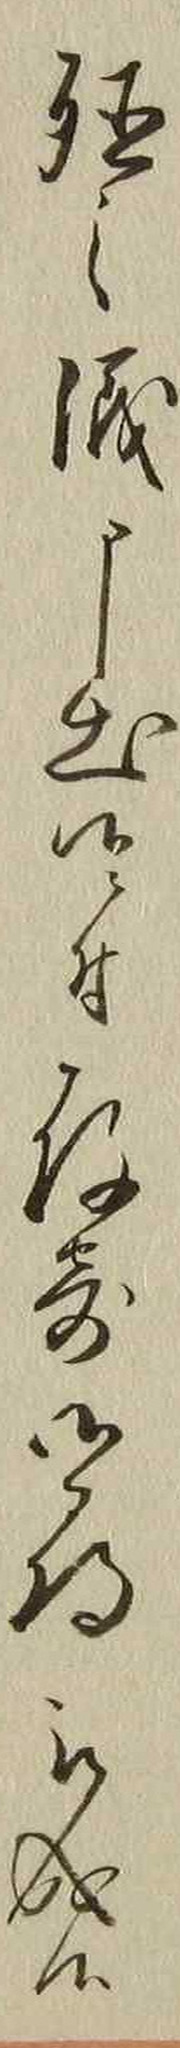聴之儀申出候ニ付存寄御尋被成候
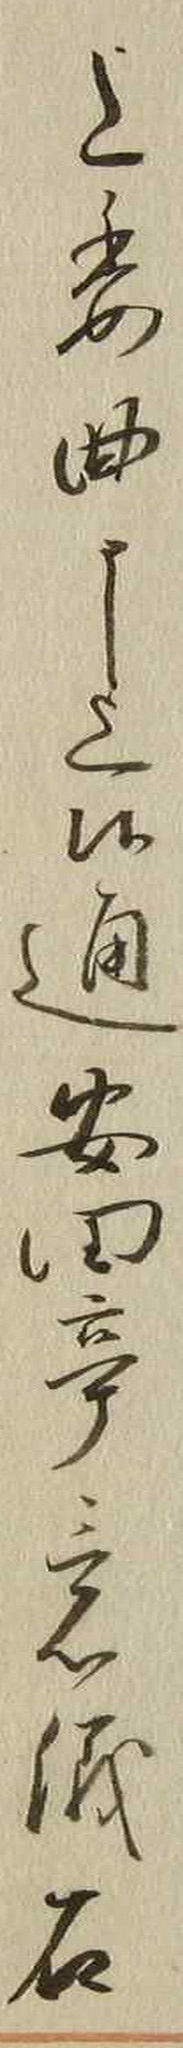上委曲申上候通安田亭意儀右
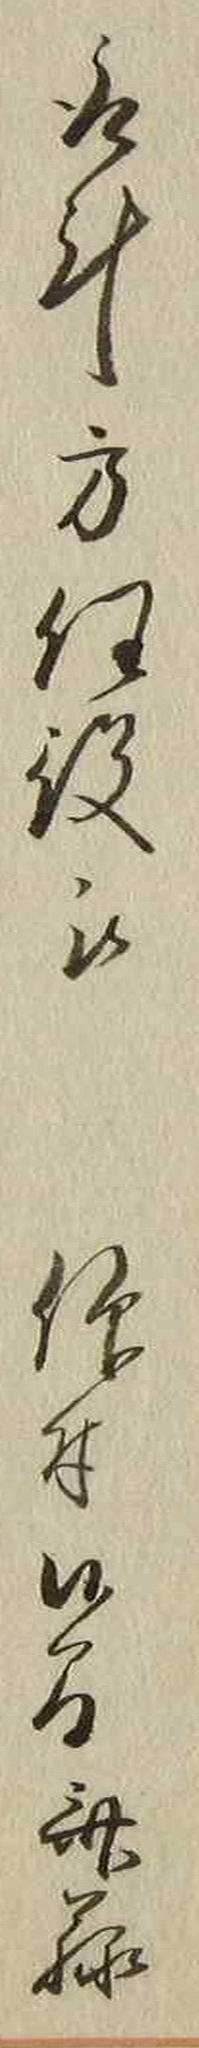取斗方任役被仰付候間斉藤
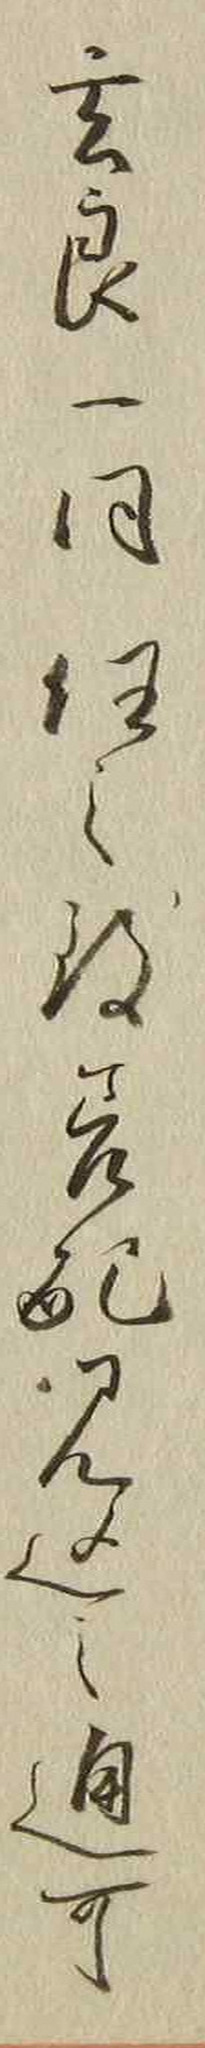玄良一同任之致差配見込之通可
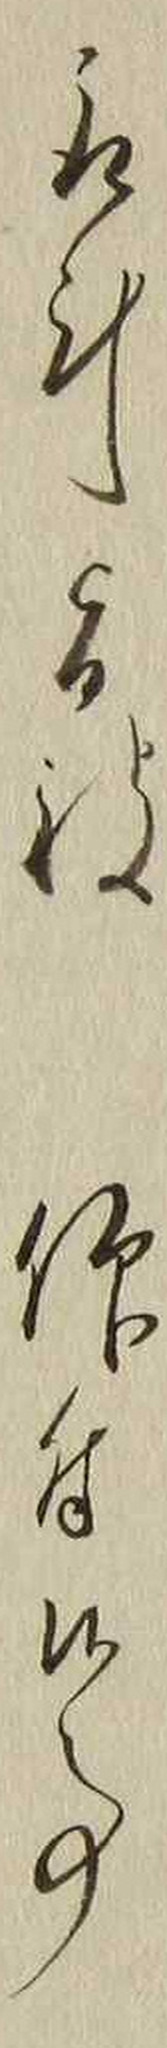取斗旨被仰付候事
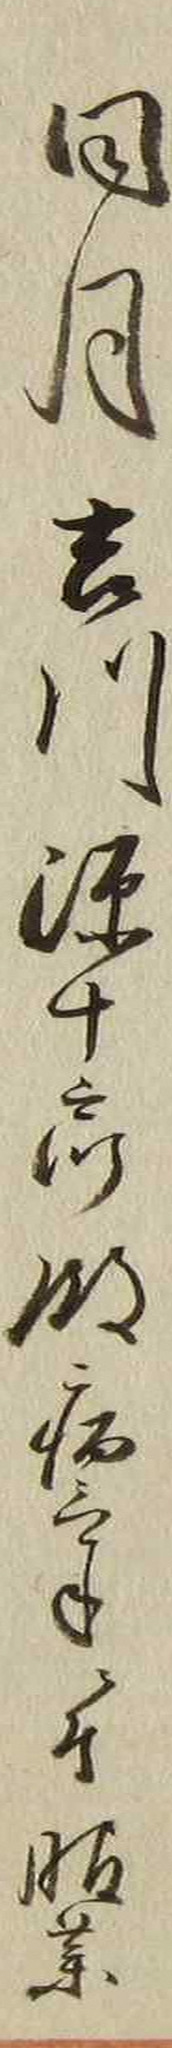一同月吉川源十郎殿病気ニ付服薬
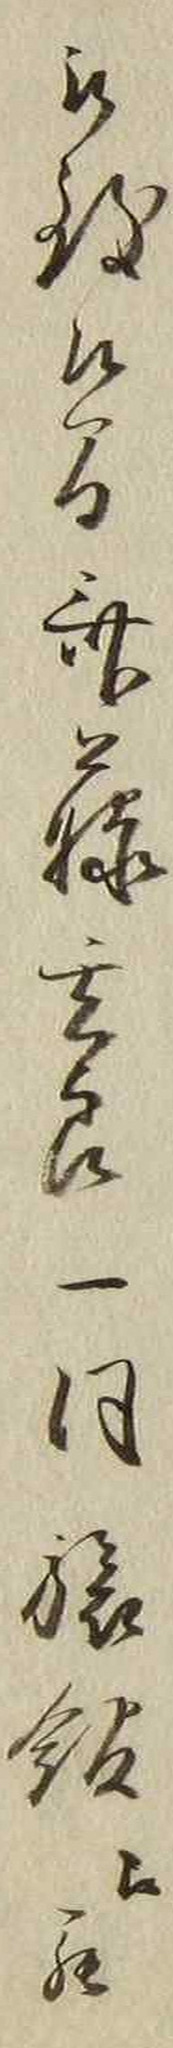被致候間斉藤玄良一同旅館江罷
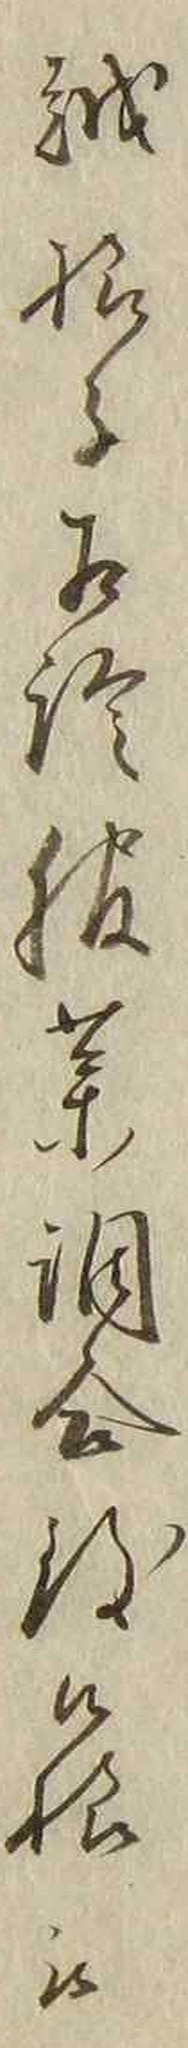越様子拝診服薬調合致候様被
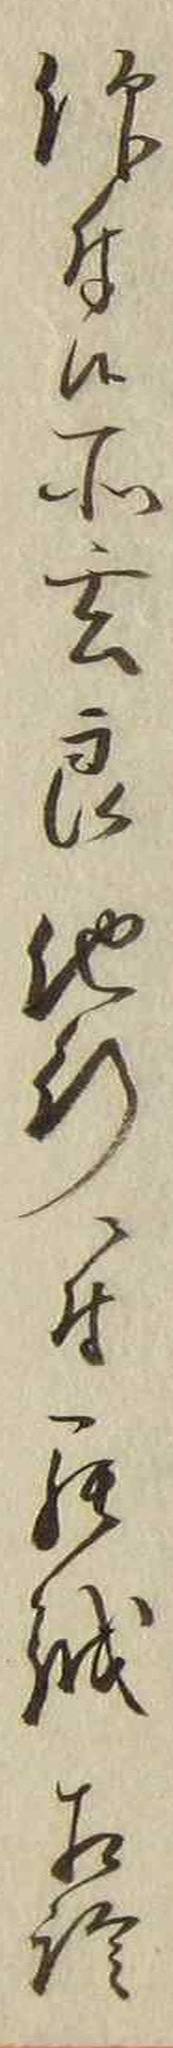仰付候所玄良他所ニ付罷越拝診

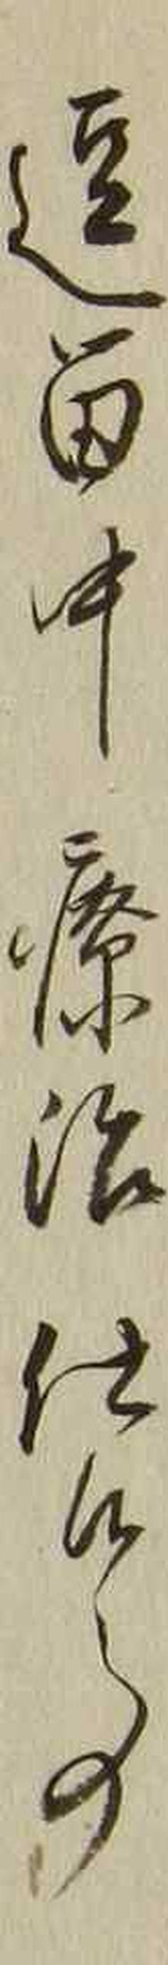逗留中療治仕候事
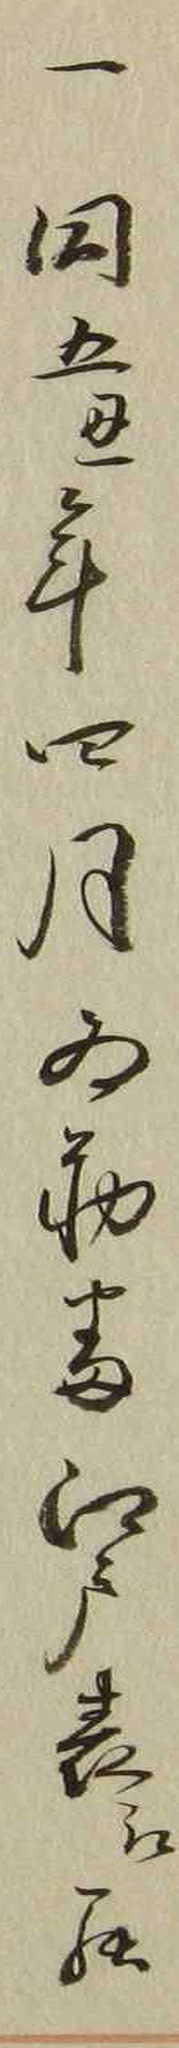一同五丑年四月為勤番江戸表江罷
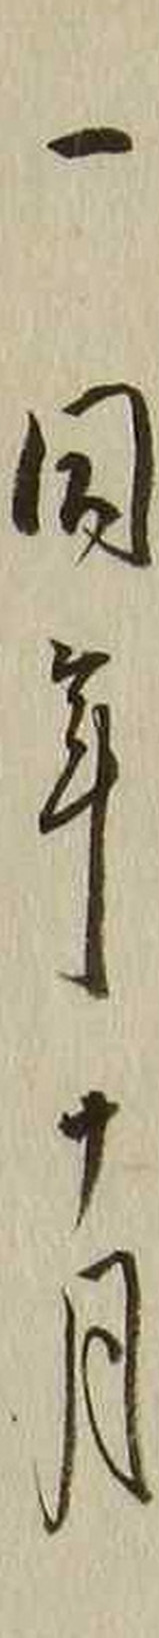一同年十月
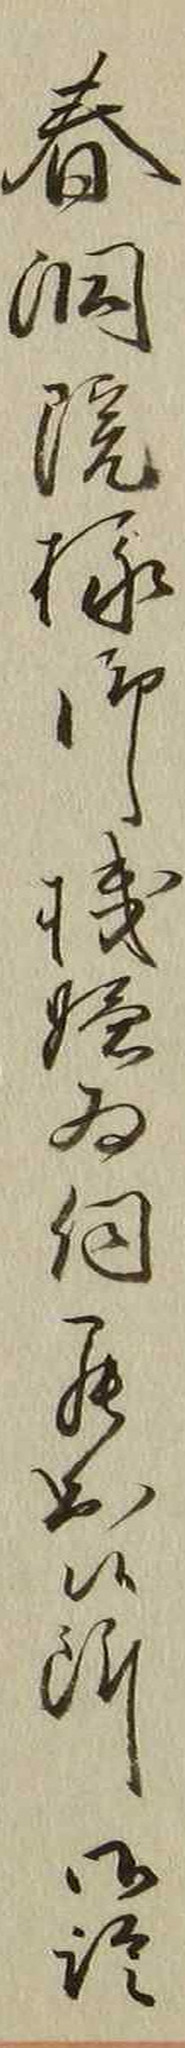春洞院様御機嫌為伺罷出候所御診
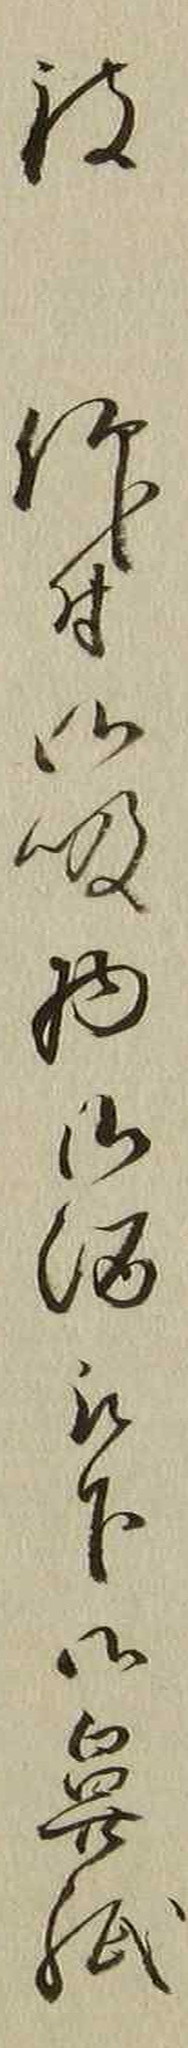被仰付御吸物御酒被下御鼻紙
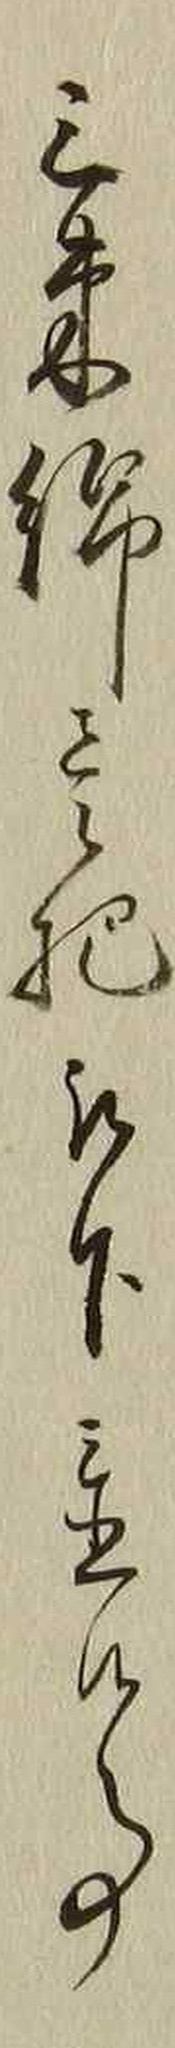三束綿壱把被下置候事
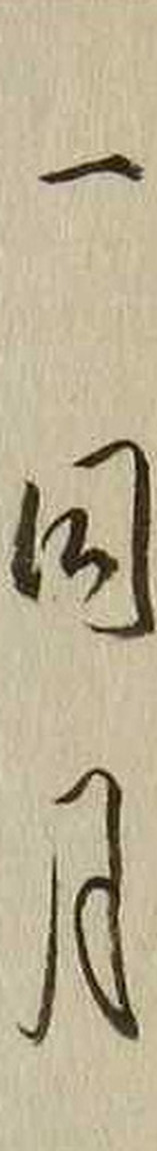一同月
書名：諸士系譜　巻之68　を之部2
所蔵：会津若松市立会津図書館
